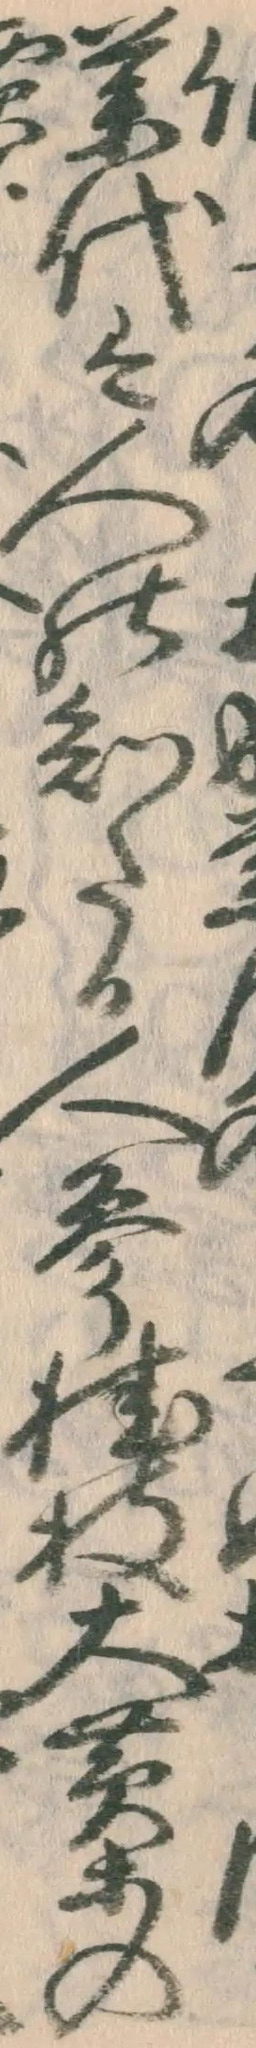薬代は人の知たる人参桂枝大黄等の
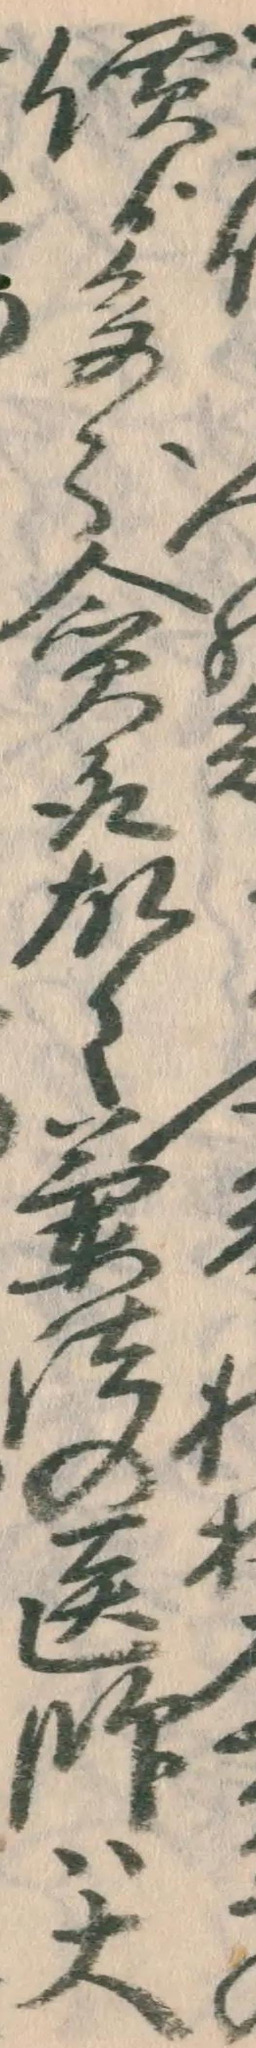價ゟ多分貪取故に蘭法の医師ハ大
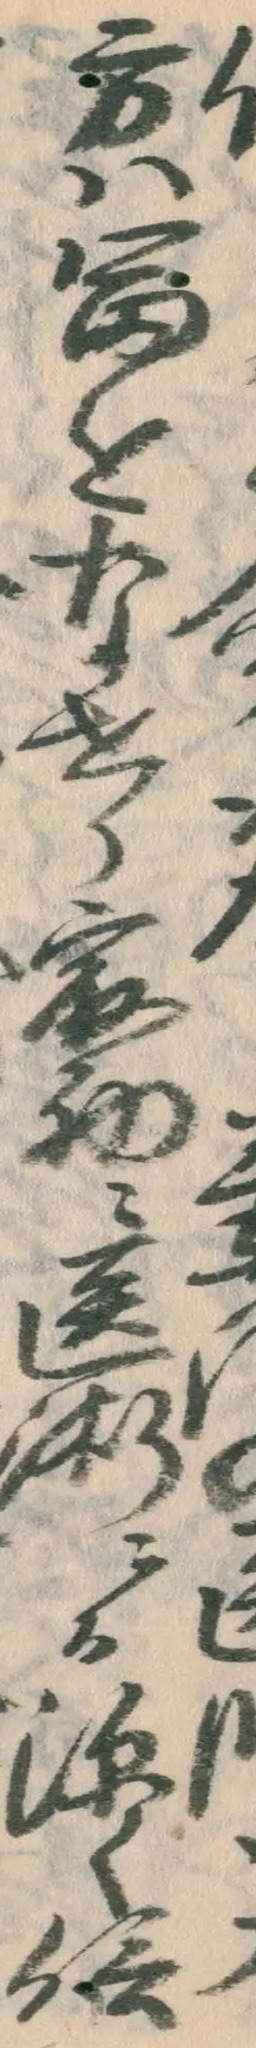方ハ富をなせり最初ニ医術ニ而深く信
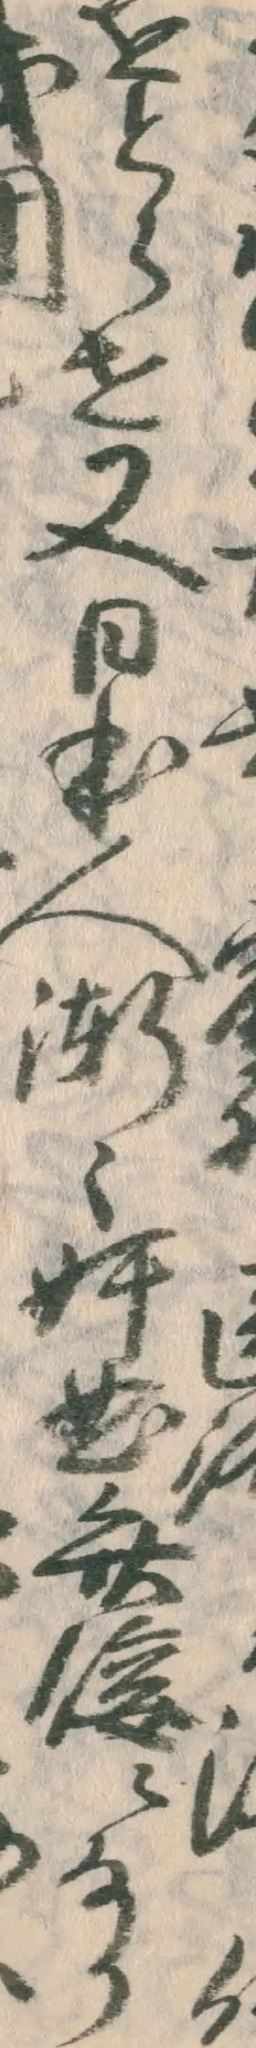をとらせ又日本人漸々奸曲弁佞ニなり
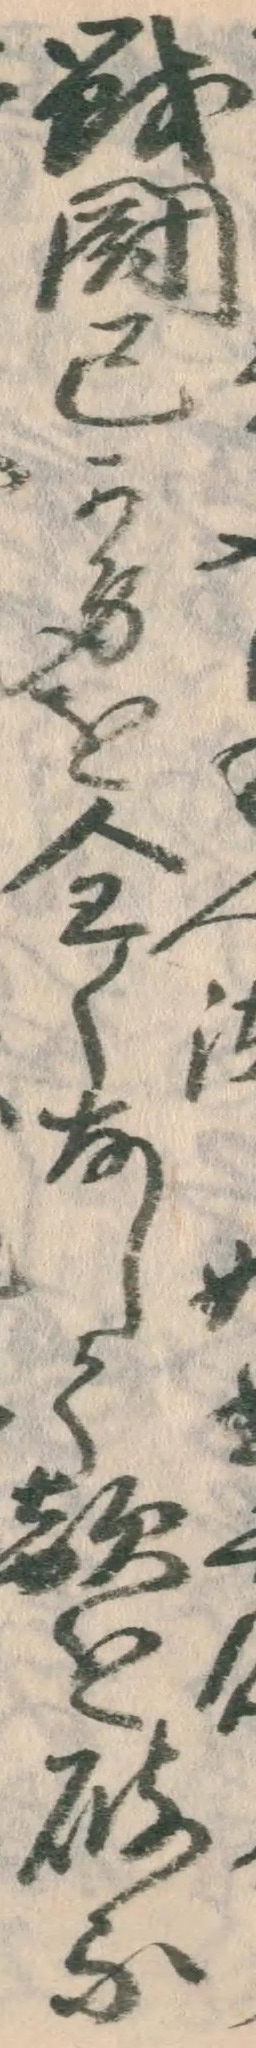戦闘己か身を全くなして敵を破る
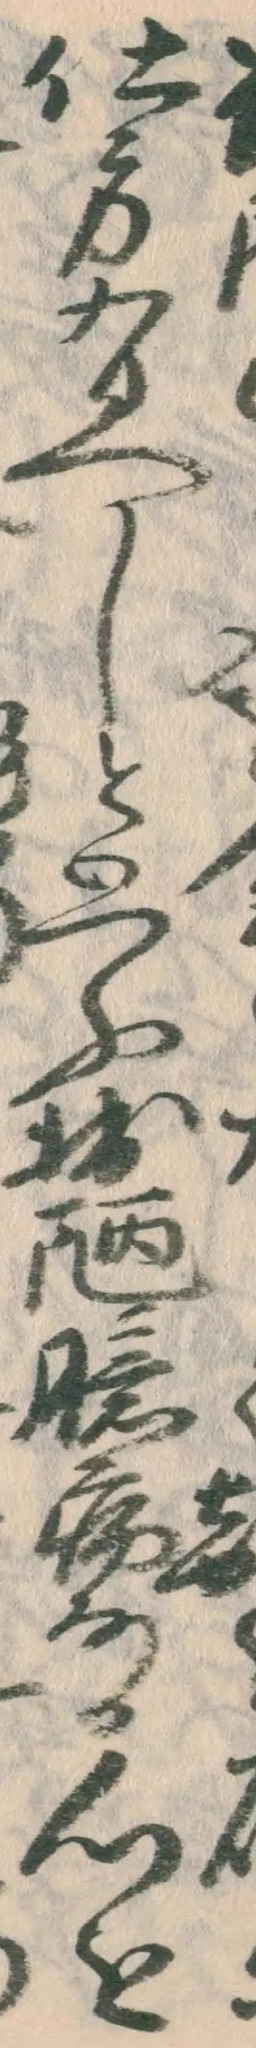仕方有へしと思ふ拙陋臆病なる心を
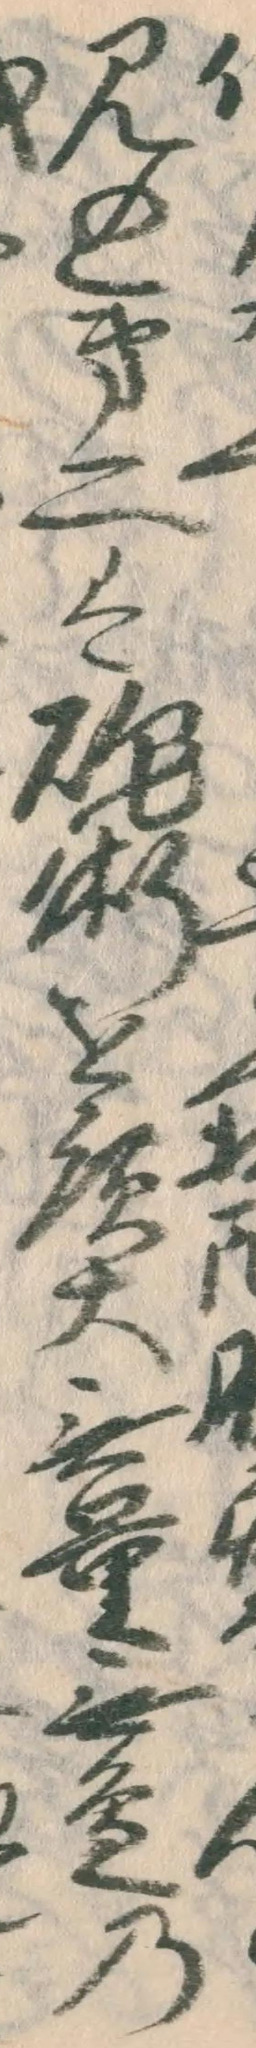見込第二は砲術を強大無量無邊の
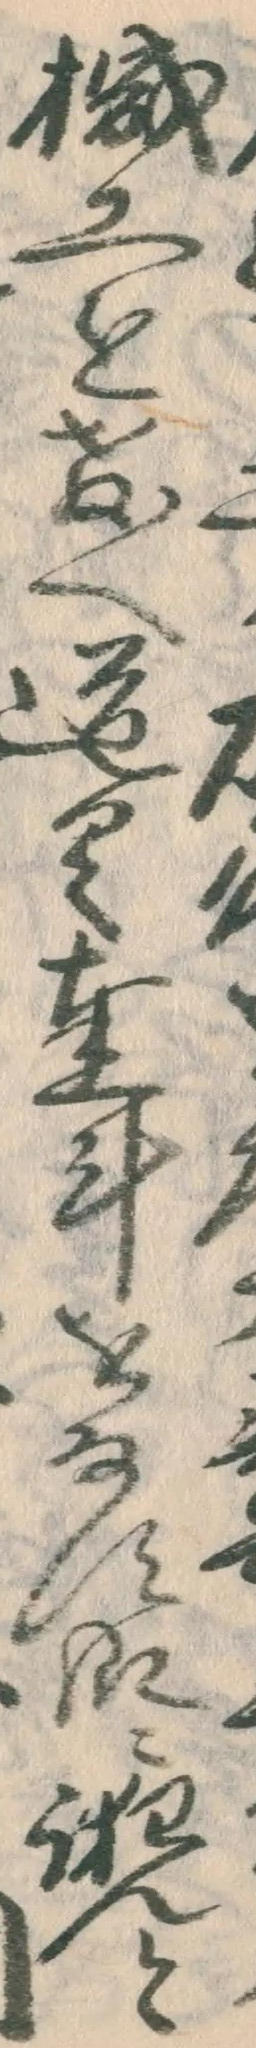機工を教へ道具達斗をなす様ニ誑んと
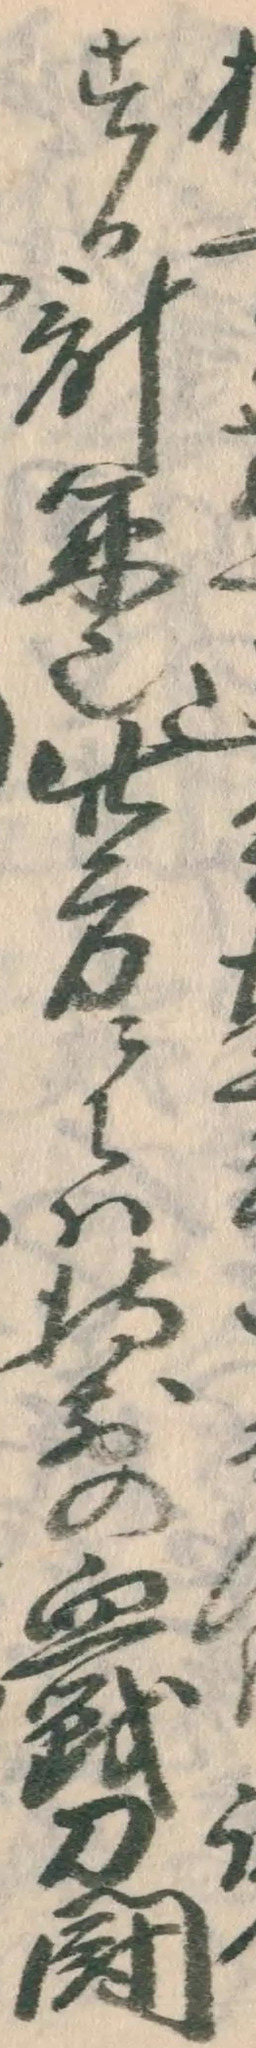する計策也此方ニてハ持前の血戦刀闘
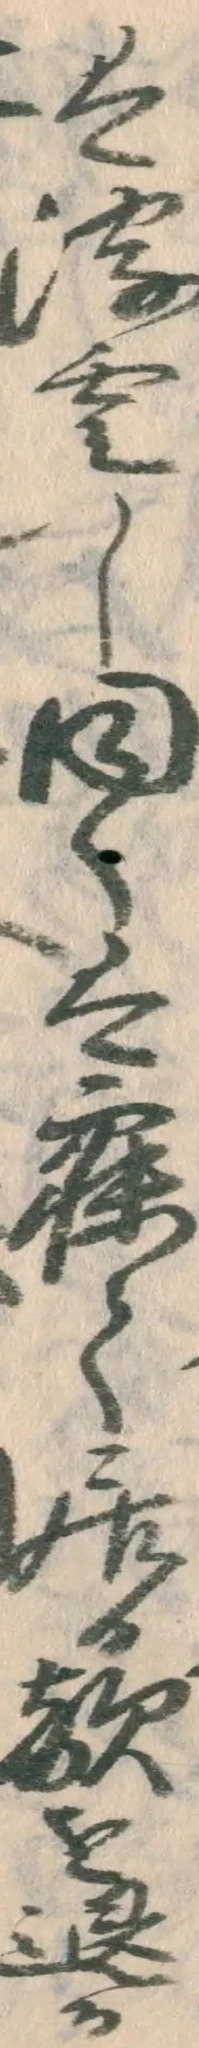は浮雲し同くは寐て居る敵を退る
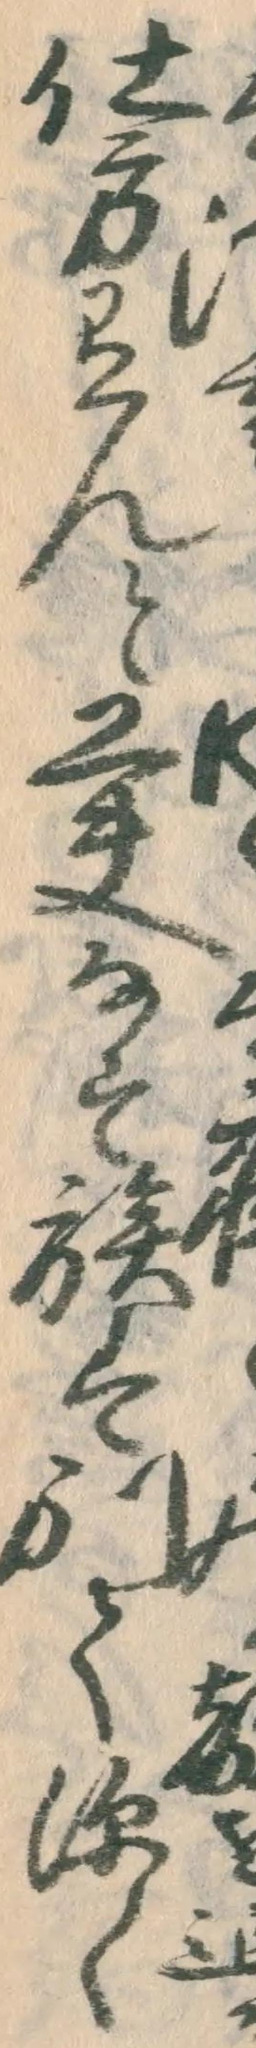仕方有んと工夫なす族は別て深く

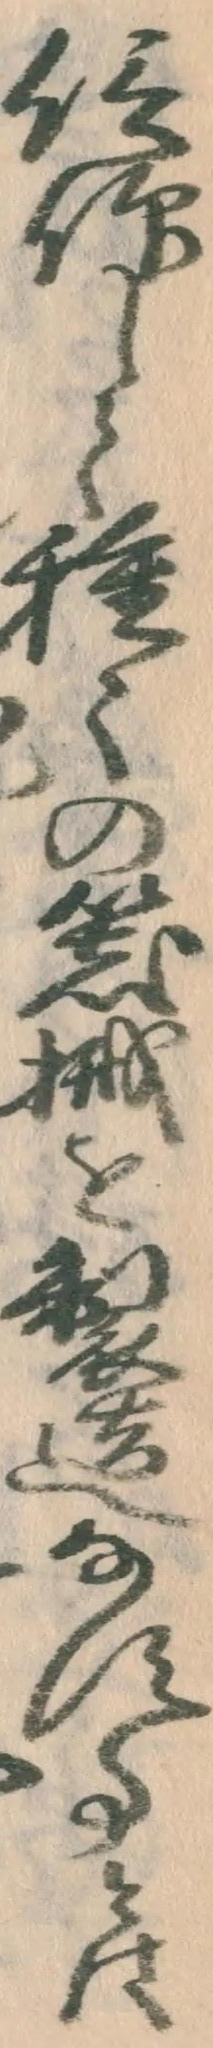信仰して種々の器械を製造なす事とは
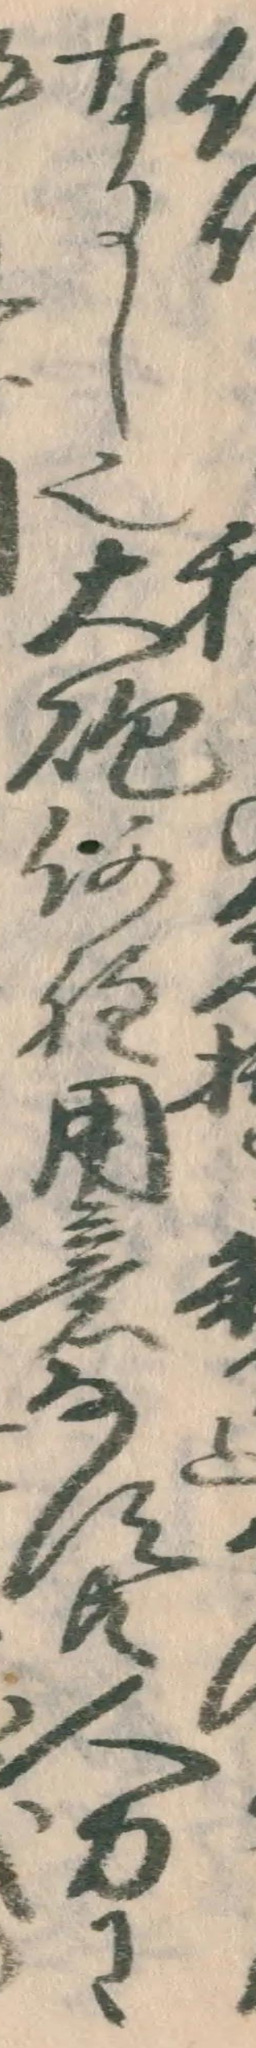なりし也大砲何程用意なす共人力に
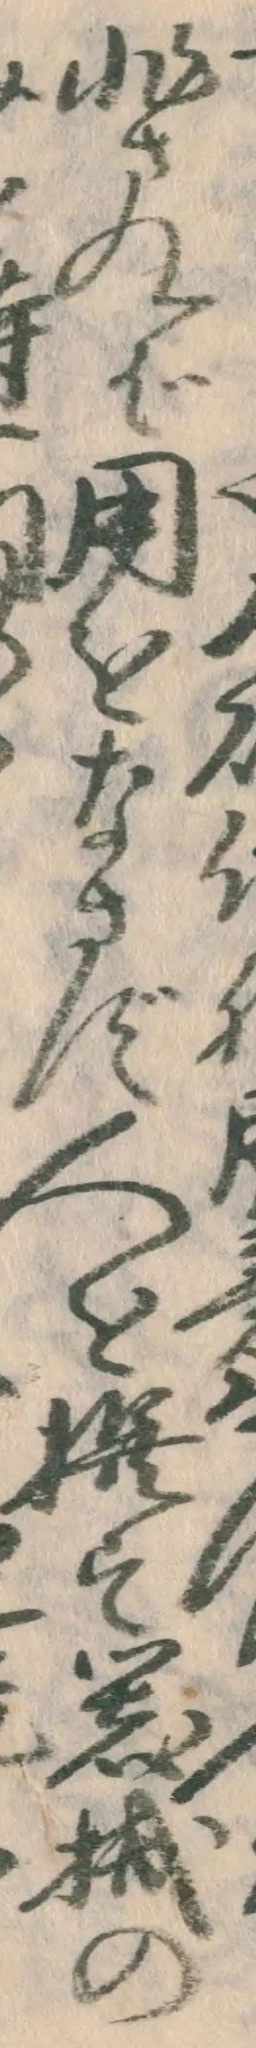非されば用をなさず人を撰す器械の
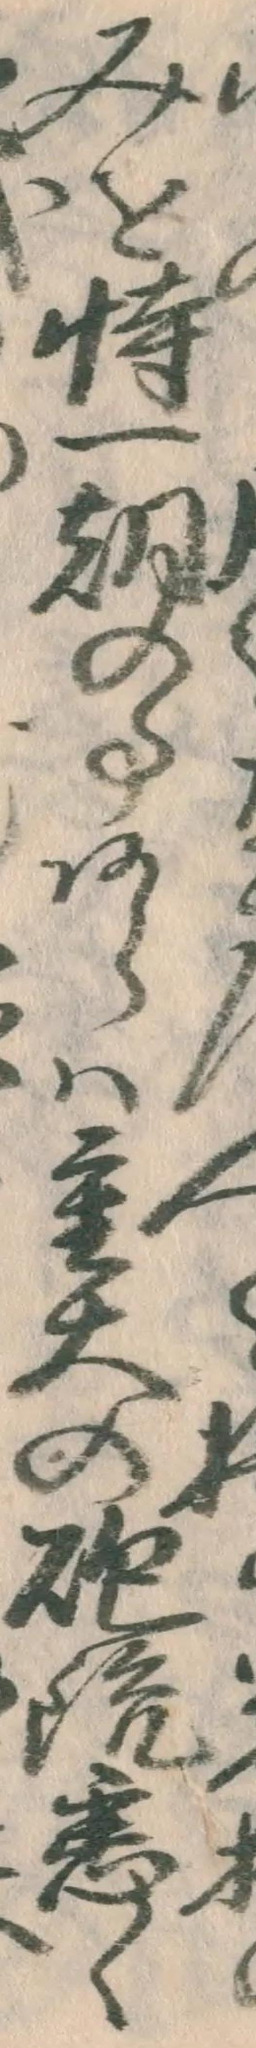みを恃一朝の事あらハ重大の砲銃悉く
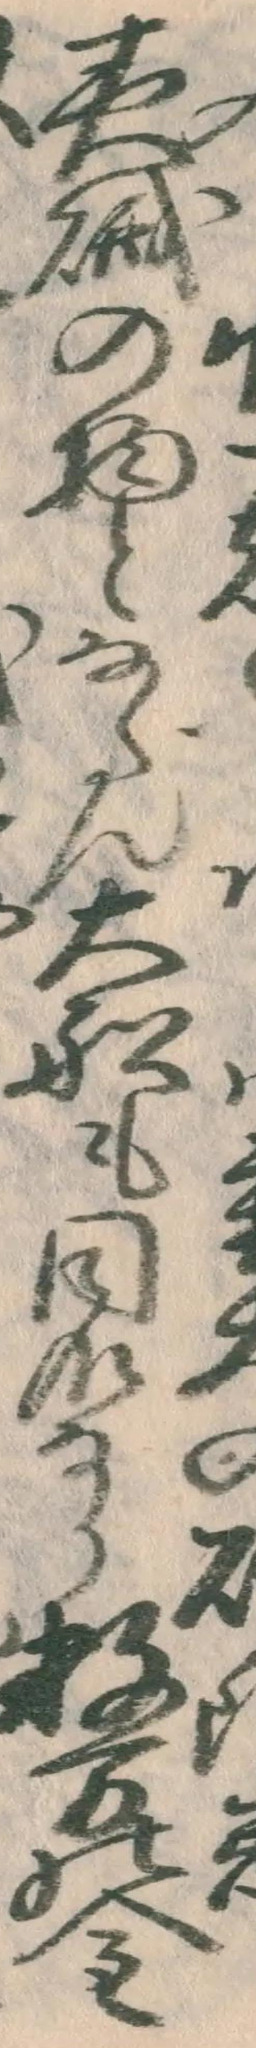夷賊の物とならん大船も同様なり数万の金
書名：麗斎叢書. 20
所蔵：国立国会図書館 National Diet Library, JAPAN
